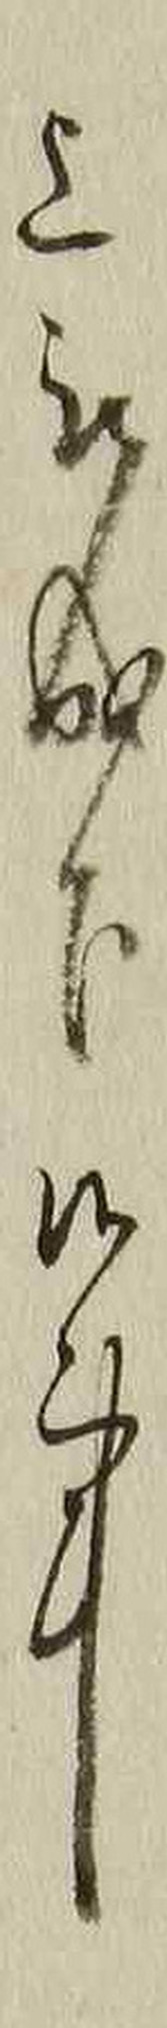上被成下候事
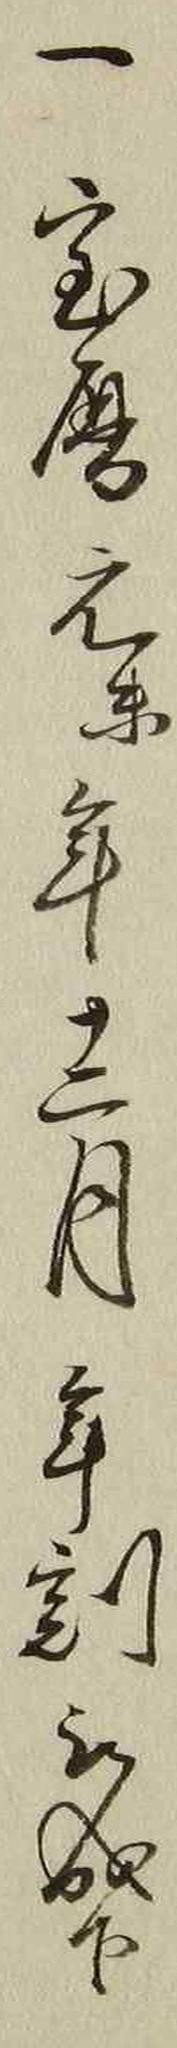一宝暦元未年十二月年割被成下
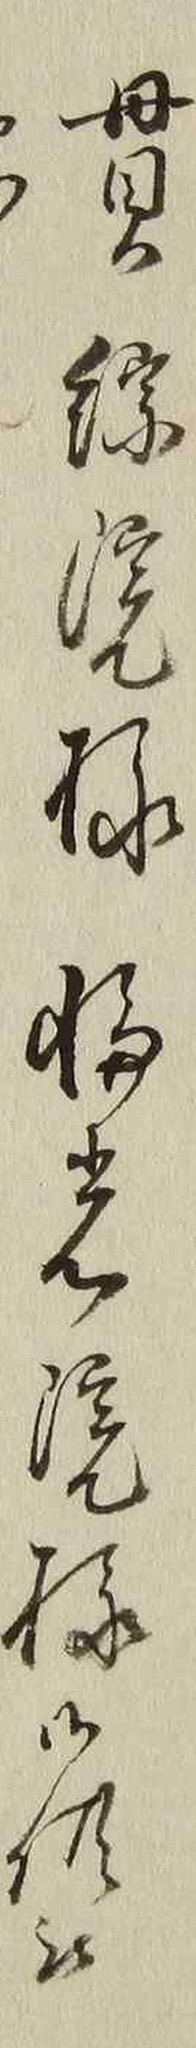貫綜院様幅光院様御供被
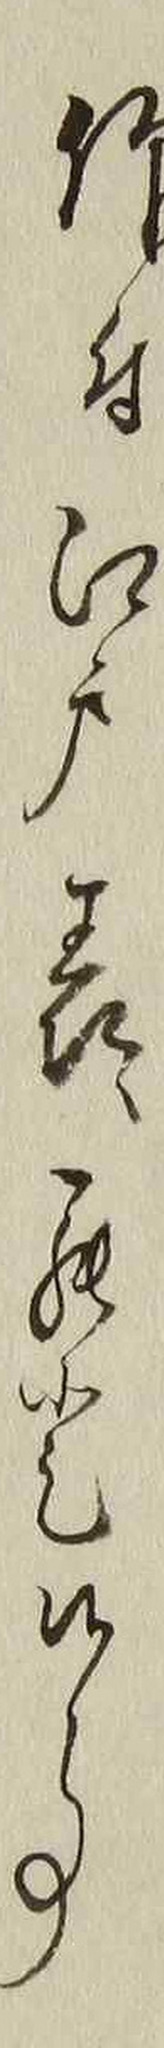仰付江戸表へ罷登候事
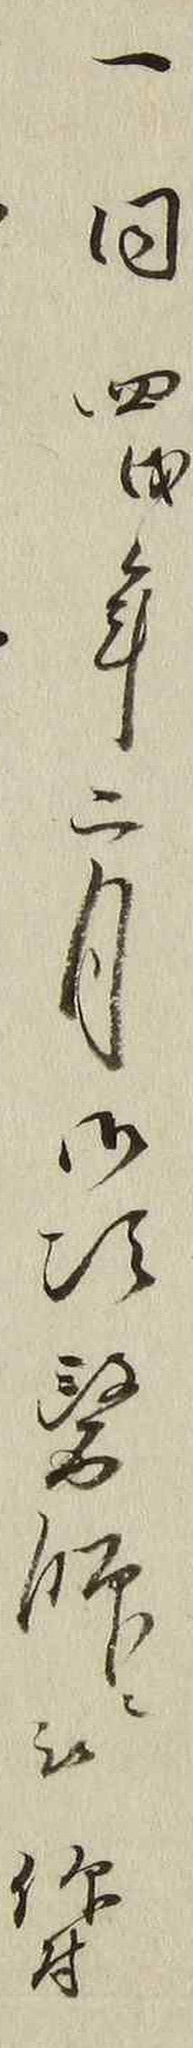一同四戌年二月御次医師ニ被仰付
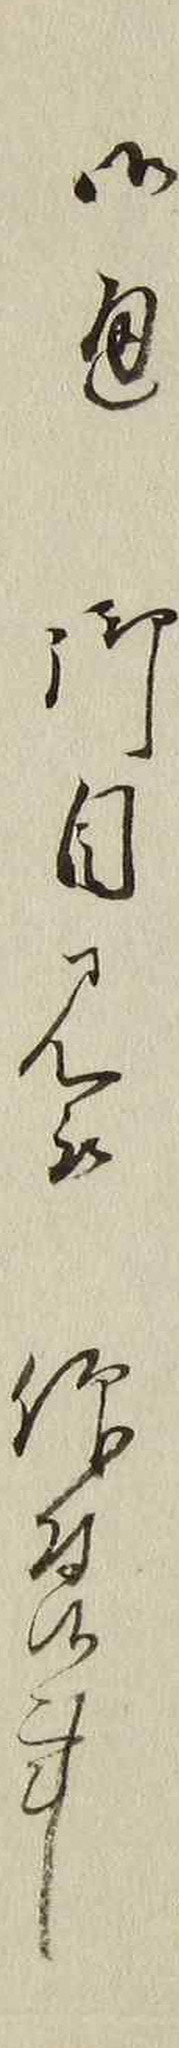御通御目見被仰付候事
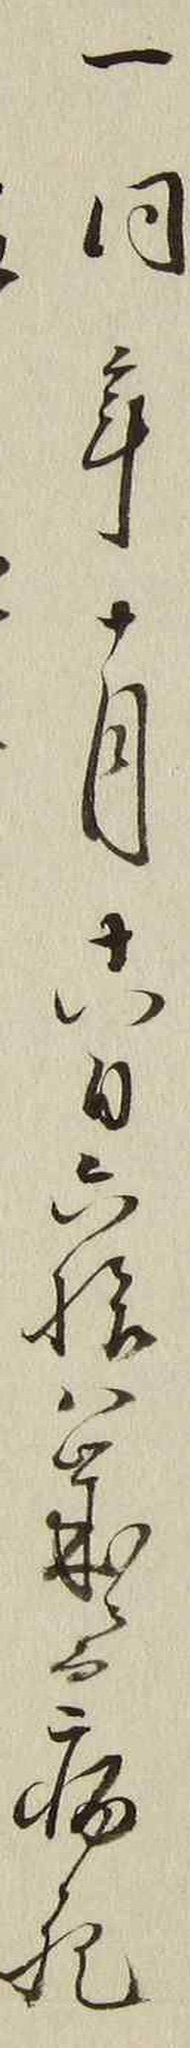一同年十月十八日六拾八歳ニ而病死
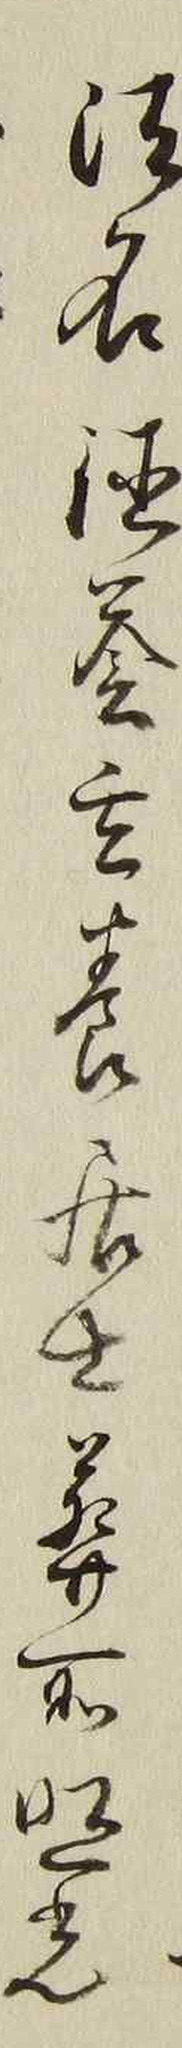法名徳誉玄養居士葬所照光
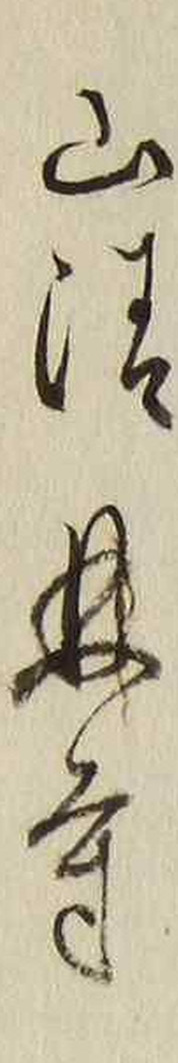山清林寺

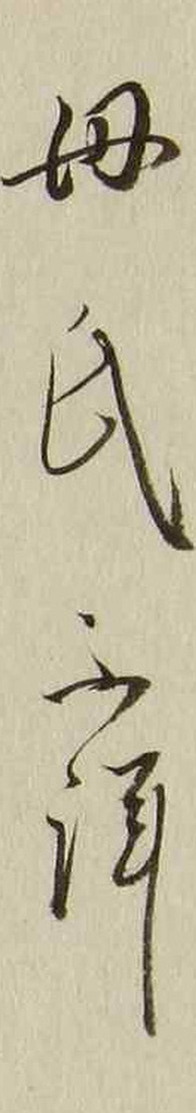母氏不詳
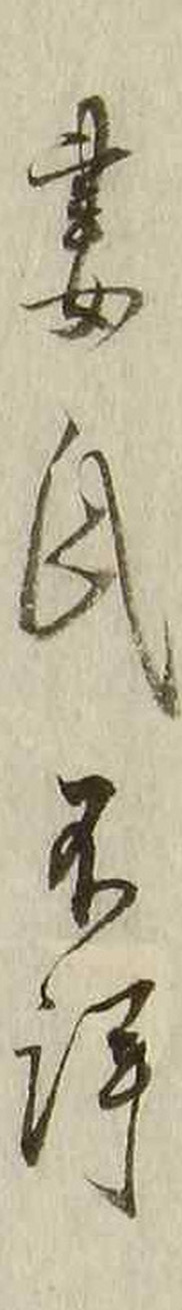妻氏不詳
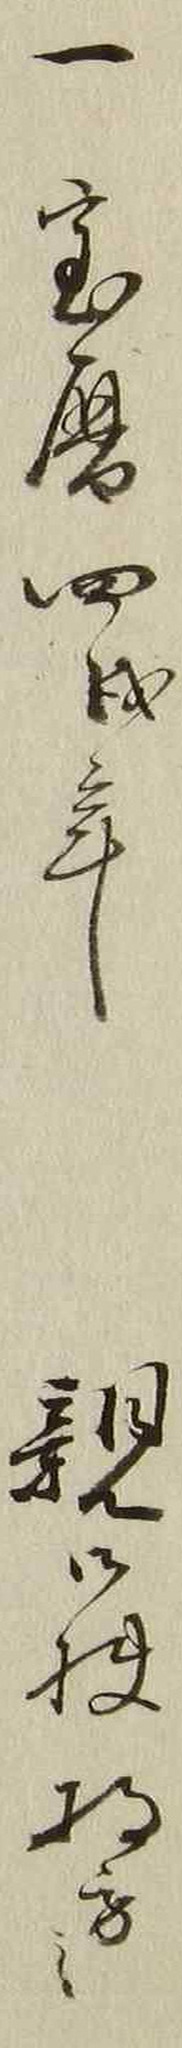一宝暦四戌年親御扶持方之
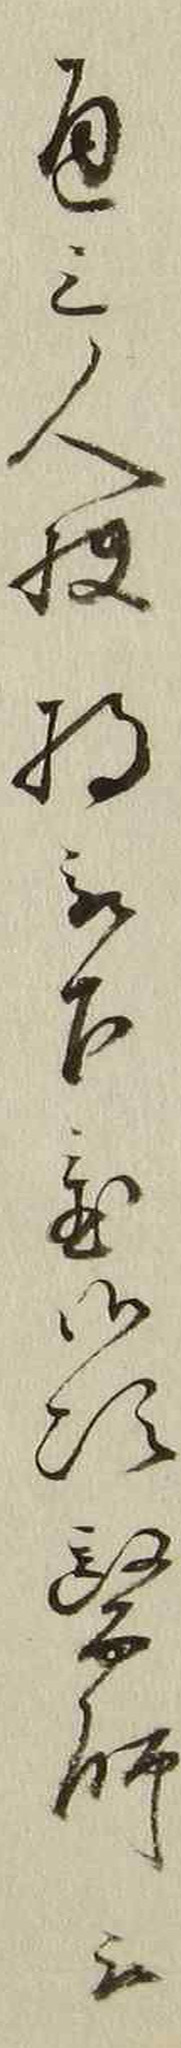通三人扶持被下置御次医師被
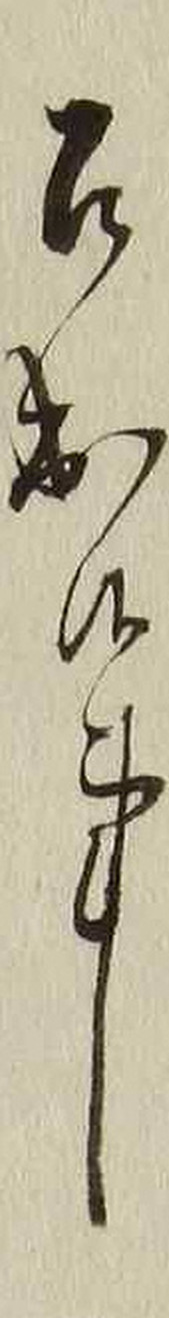召出候事
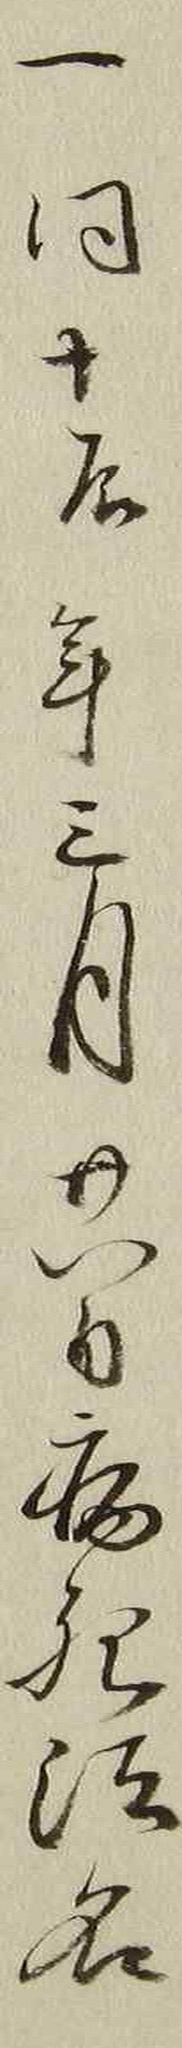一同十辰年三月廿八日病死法名
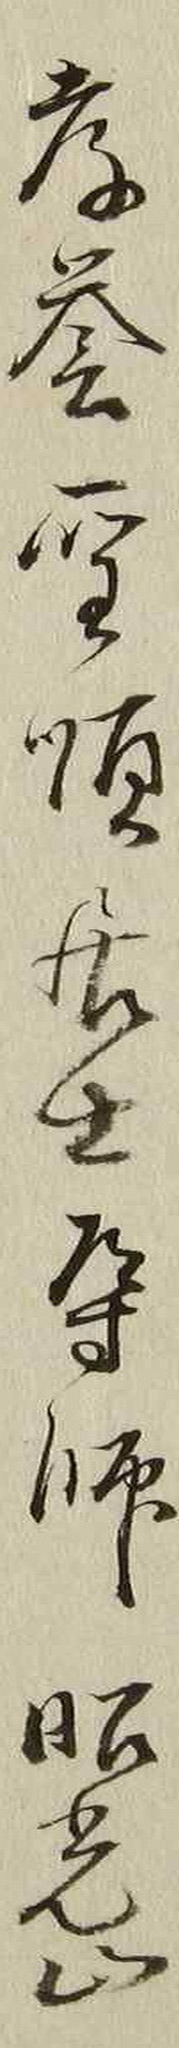孝誉聖順居士導師昭光山
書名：諸士系譜　巻之129　た之部5
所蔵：会津若松市立会津図書館
